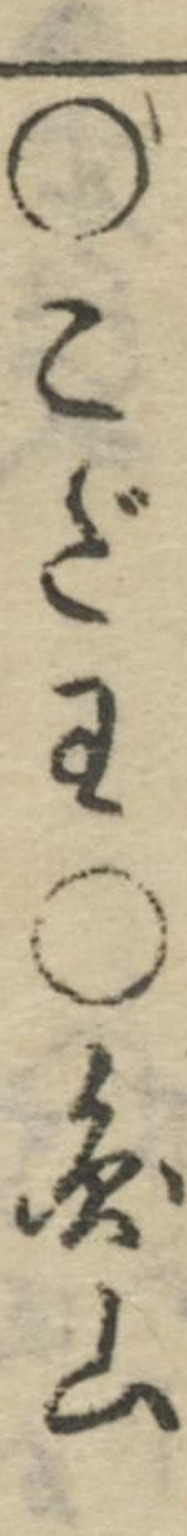○こだわ○円山
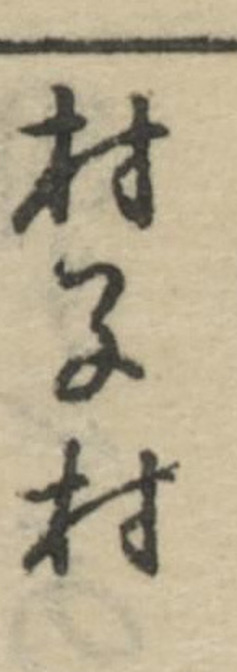村子村
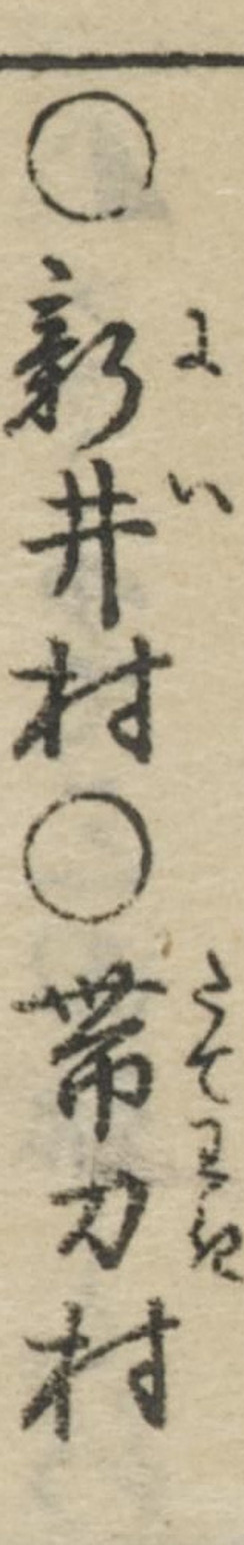○新井村○帯刀村
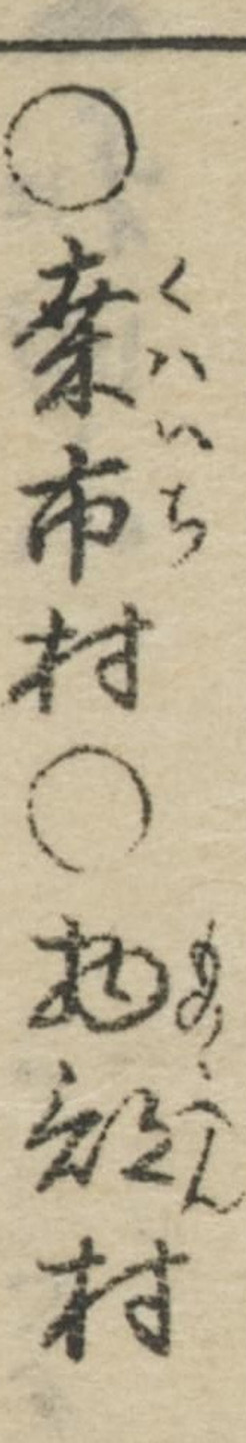○桑市村○物部村
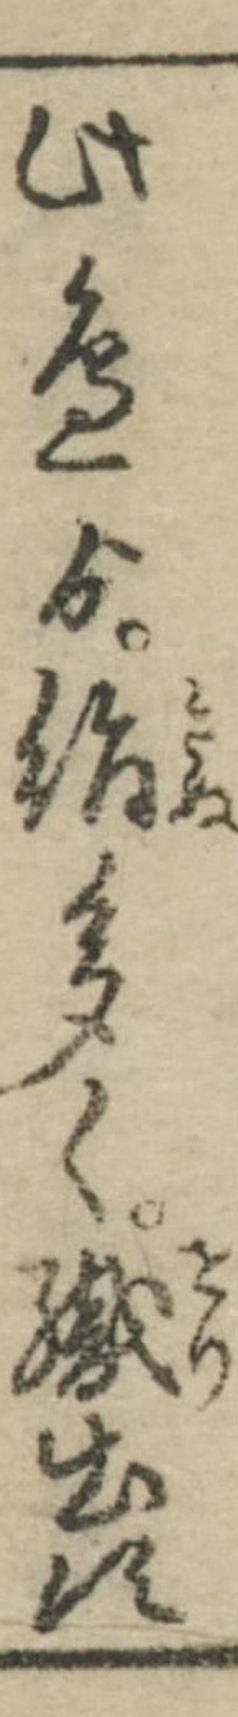此辺ゟ。絹多く。織出す

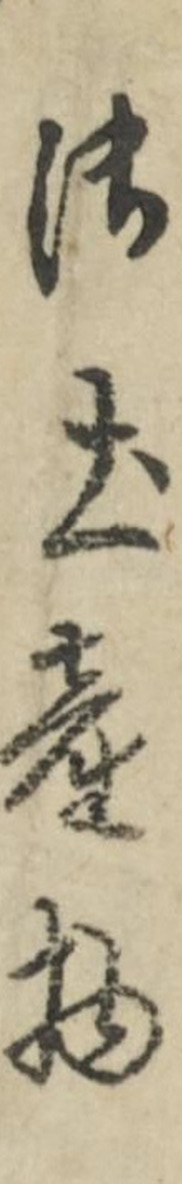御土産物
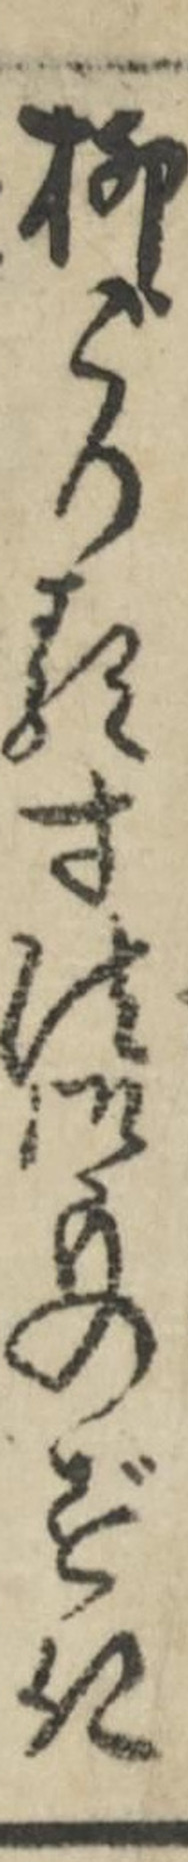柳ごり類寸法御ものずき
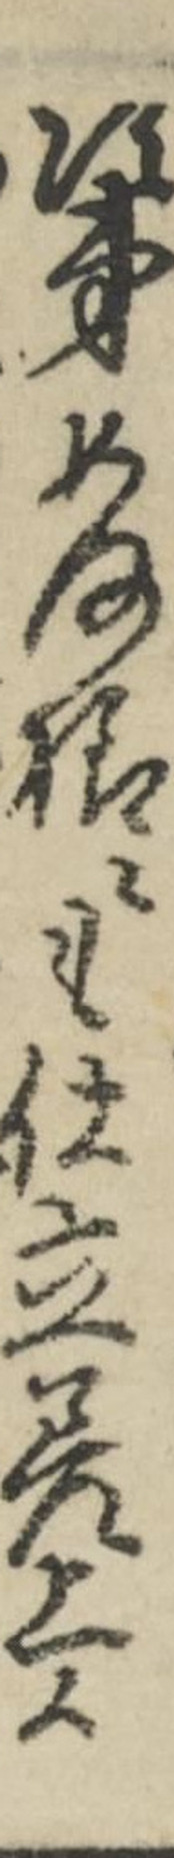次第如何様にも仕立差上候
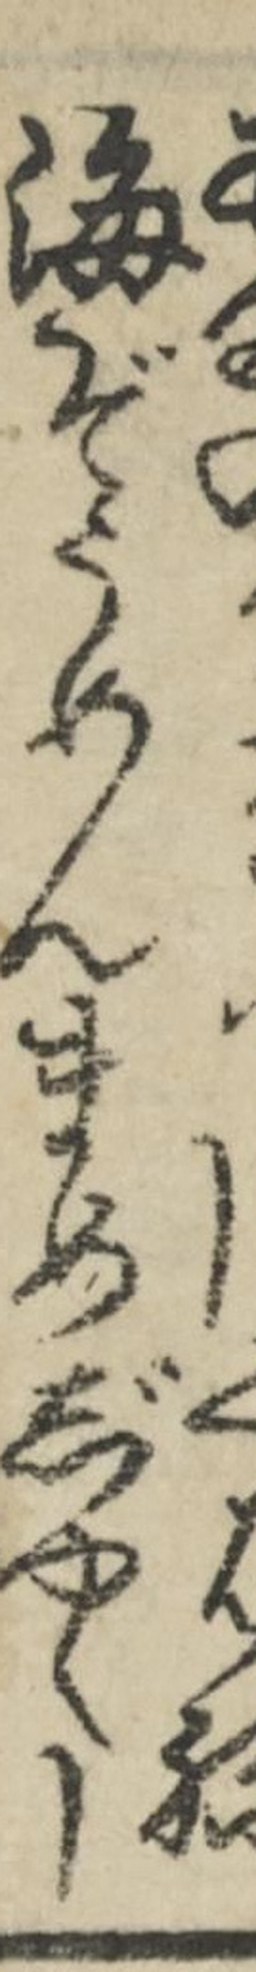海ぞうめんまめじやくし
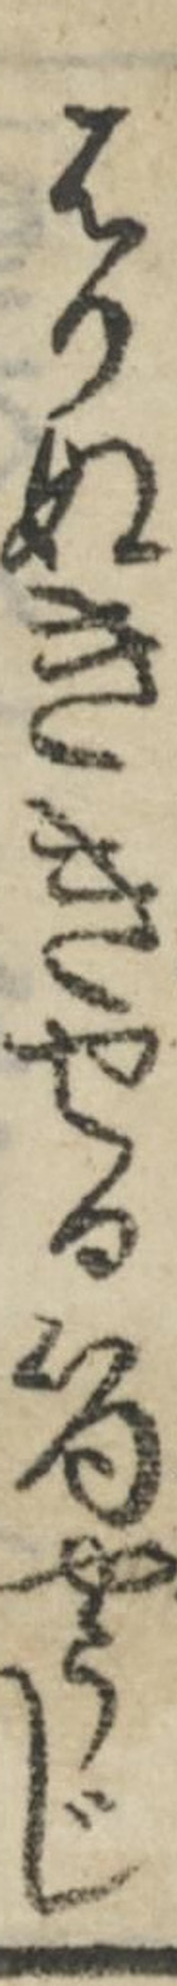はりぬききせる筒やうじ
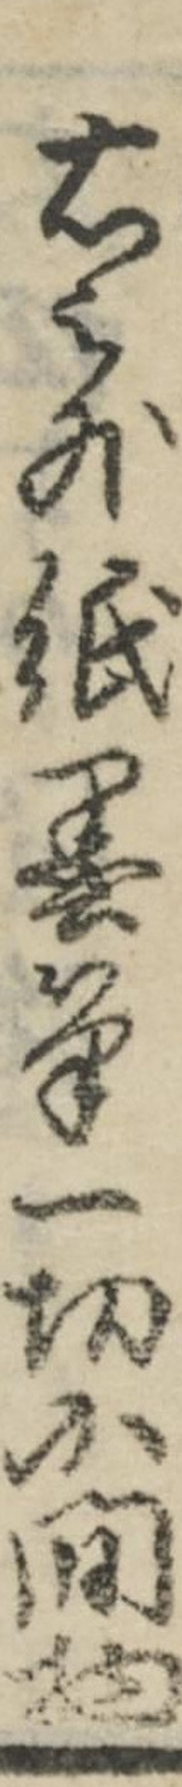右之外紙墨筆一切小間物
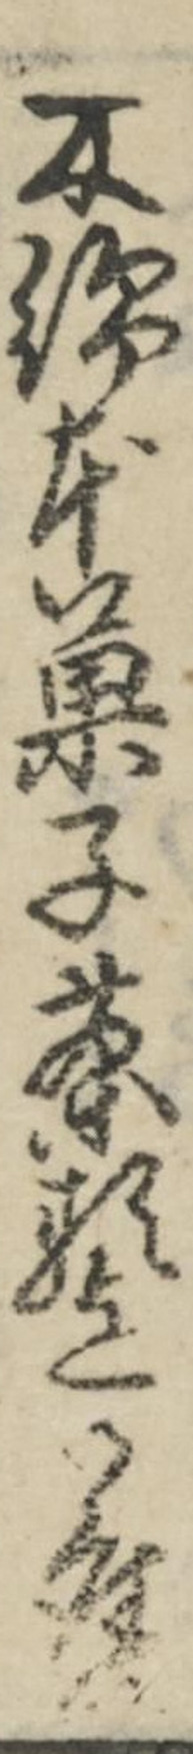木綿本菓子茶類迄御座候
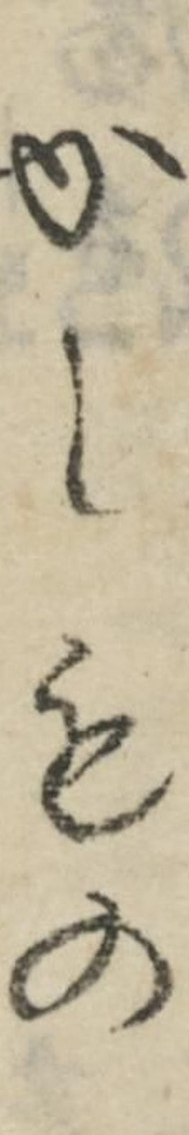かしもの
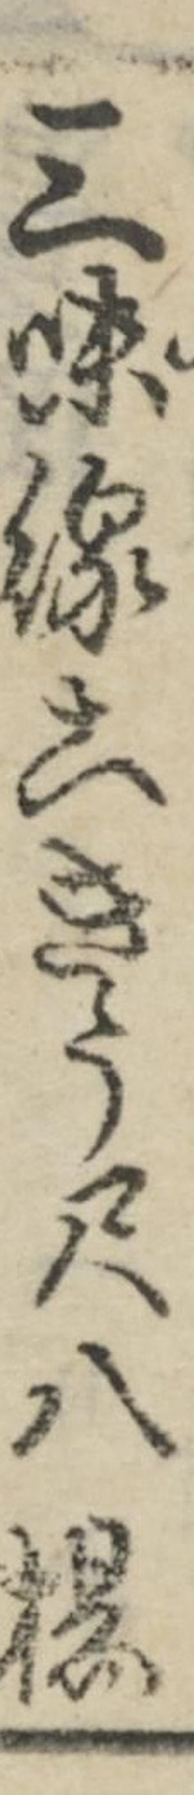三味線こきう尺八楊
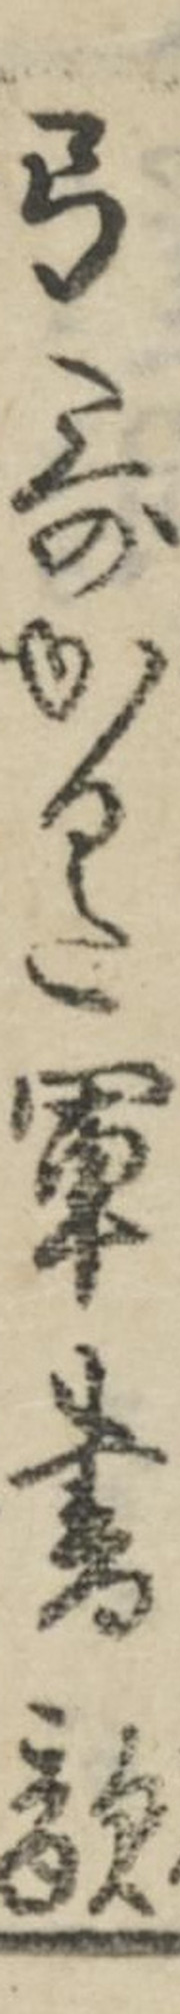弓歌かるた軍書敵
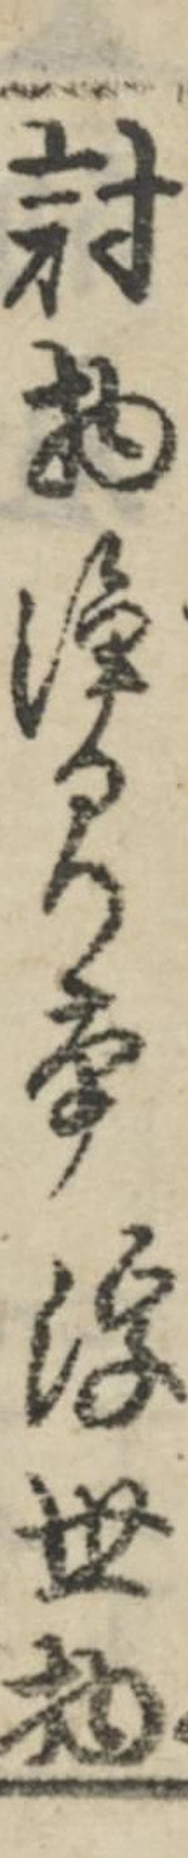討物浄るり本浮世物
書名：但州城崎浴湯辧
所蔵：東京大学地震研究所図書室 Earthquake Research Institute Library, The University of Tokyo, JAPAN
